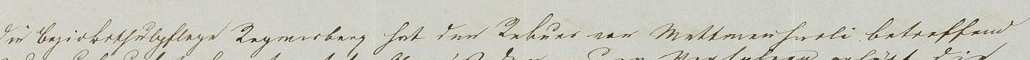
Die Bezirksschulpflege Regensberg hat den Rekurs von Mettmenhasli betreffend
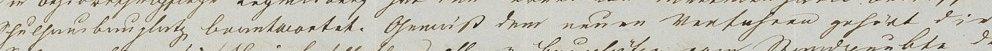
Schulhausbauplatz beantwortet. Gemäß dem neuen Verfahren gehört die
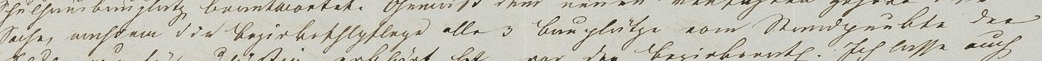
Sache, nachdem die Bezirksschlpflege alle 3 Bauplätze vom Standpunkte der
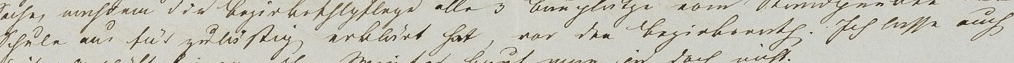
Schule aus für zuläßig erklärt hat, vor den Bezirksrath. Ich lasse auch
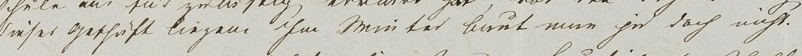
dieses Geschäft liegen. Im Winter baut man ja doch nicht.
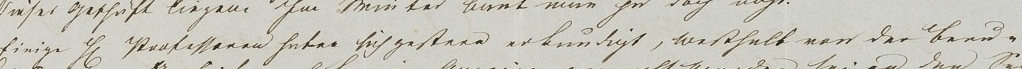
Einige Herren Professoren haben sich gestern erkundigt, weßhalb von der Beru-
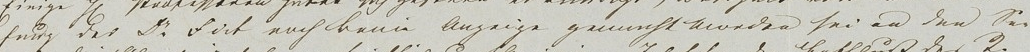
fung des DrFick noch keine Anzeige gemacht worden sei an den Se-
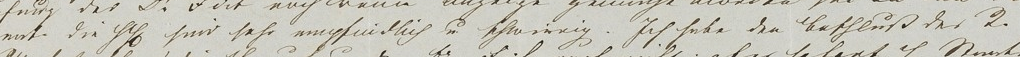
nat. Die HH sind sehr empfindlich u. schwierig. Ich habe den Beschluß des R.
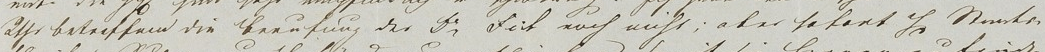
Rths betreffend die Berufung des DrFick noch nicht; aber sofort Herrn Staats-
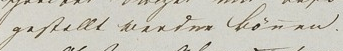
gestellt werden können.
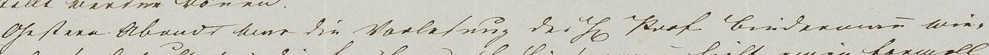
Gestern Abends war die Vorlesung des Herrn Prof. Biedermann wie-
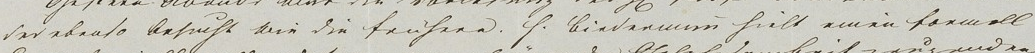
der ebenso besucht wie die frühern. H. Biedermann hielt einen formell
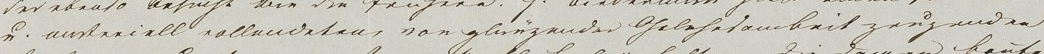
u. materiell vollendeten, von glänzender Gelehrsamkeit zeugenden
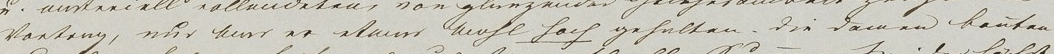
Vortrag, nur war er etwas wohl hoch gehalten. Die Damen konnten
